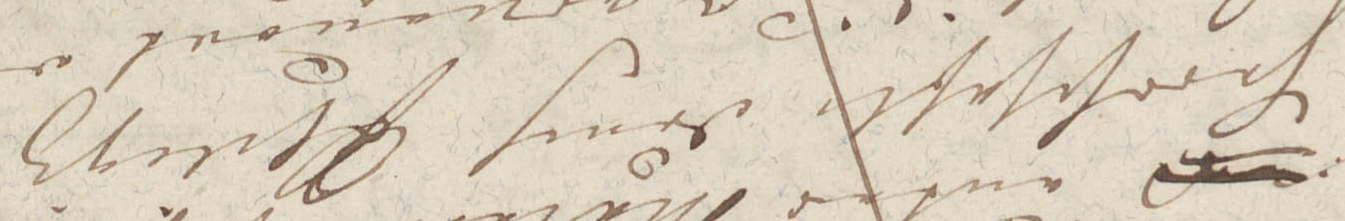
alter Zeit. aus dem alten Reiche.
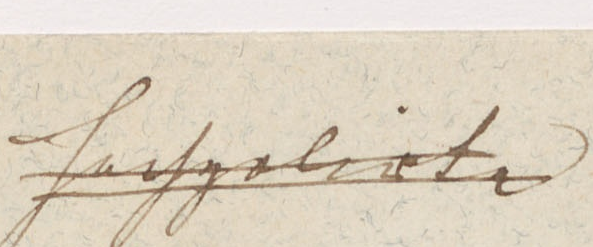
hochpolirte
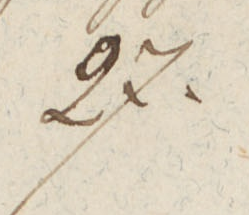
27.
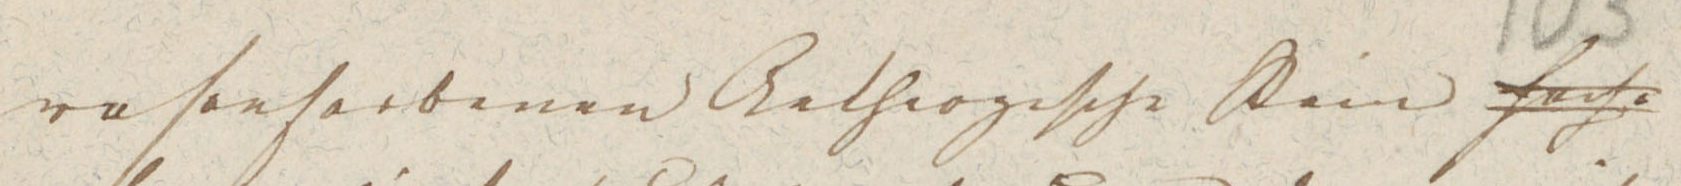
rosenfarbenen Aethiopische Stein hoch
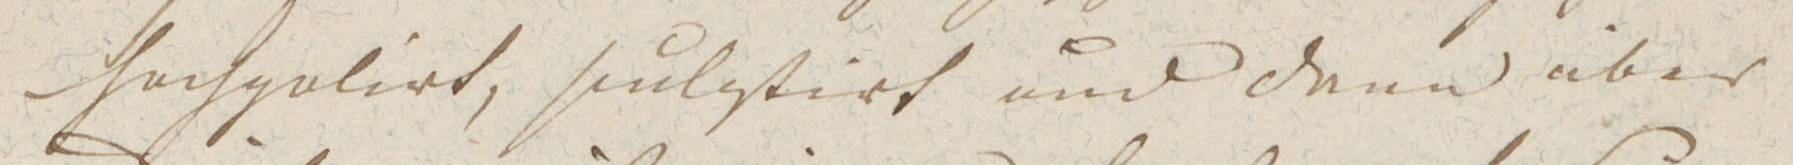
hochpolirt, sculptirt und dann über
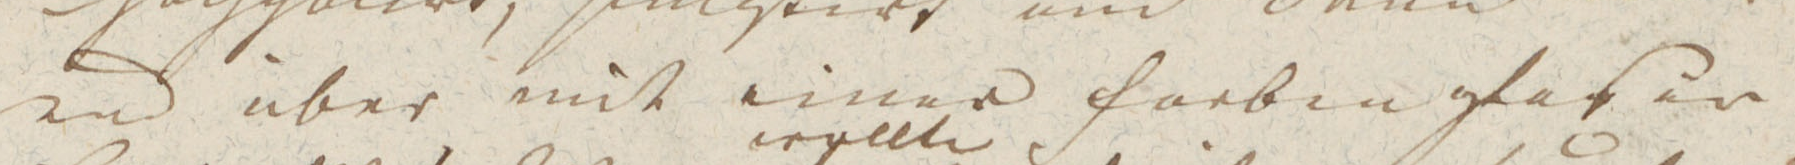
und über mit einer Farbenglasur
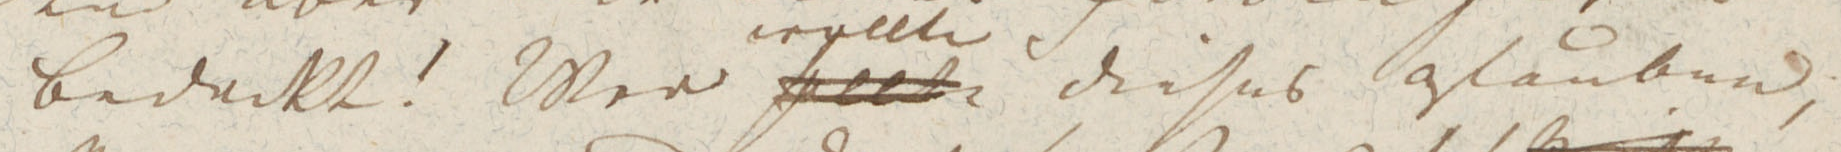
bedeckt! Wer sollte wollte dieses glauben,
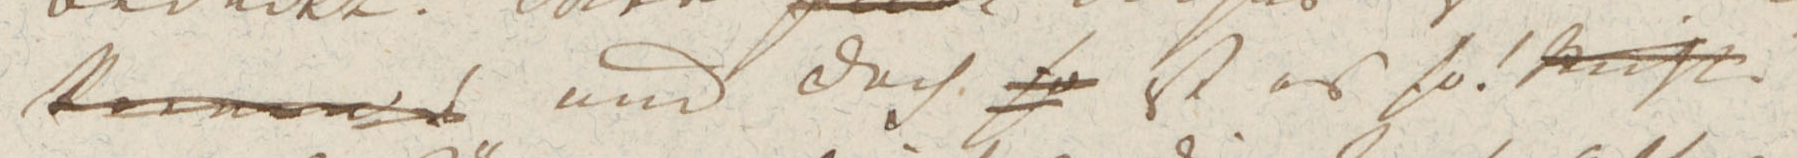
konnens und doch so ist es so! Nicht
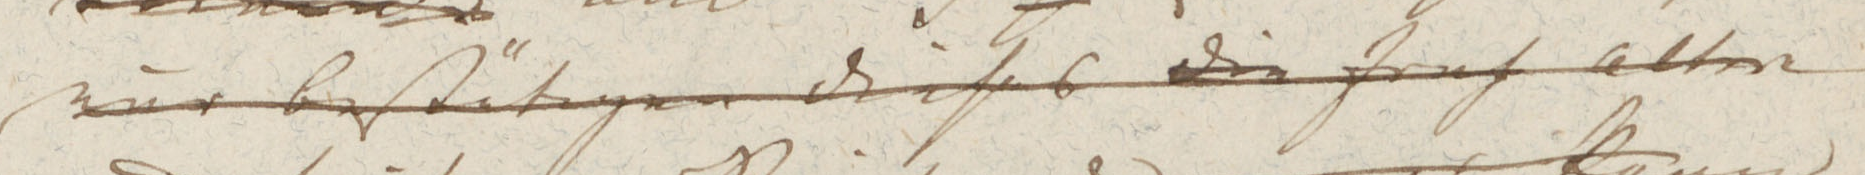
nur bestätigen dieses die fruh alten
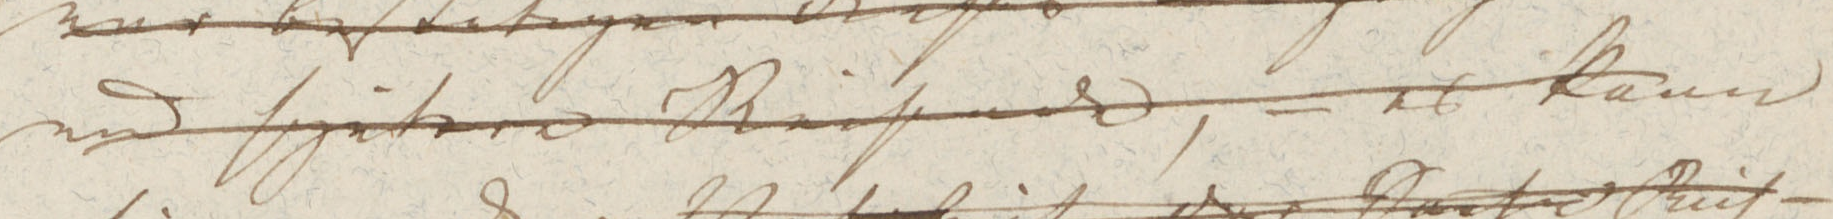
und spätere Reisende, – es kann
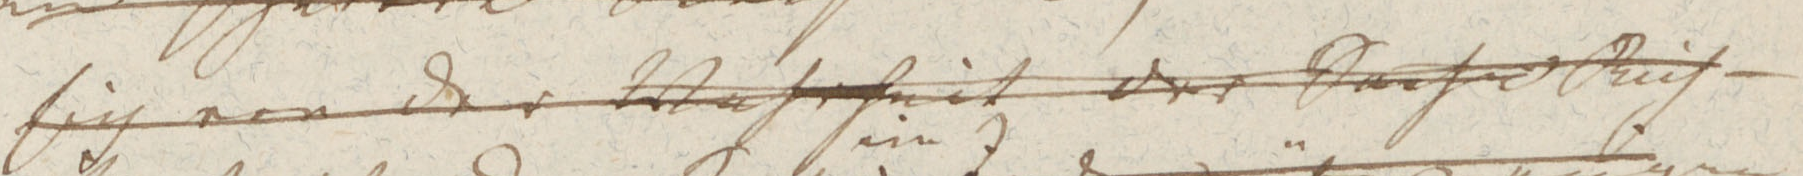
sich von der Wahrheit der Sache Rich-
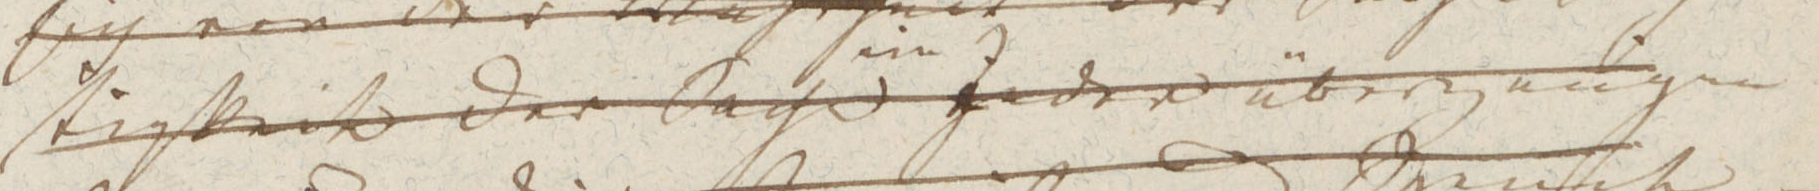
tigkeit der Sache ein jJeder überzeugen
